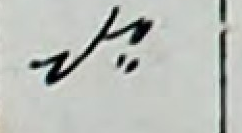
do
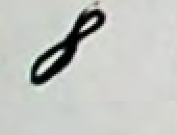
8
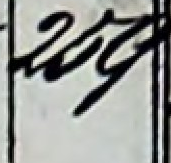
259
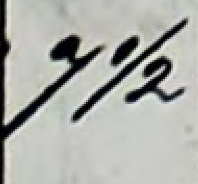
7 ½
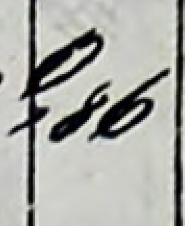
0,86
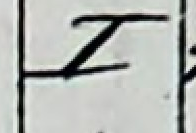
I
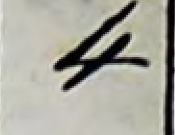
4
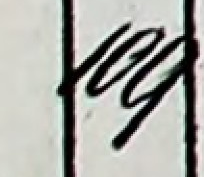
109
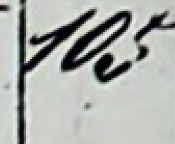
105
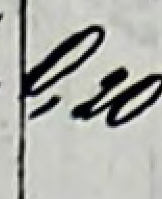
0,20
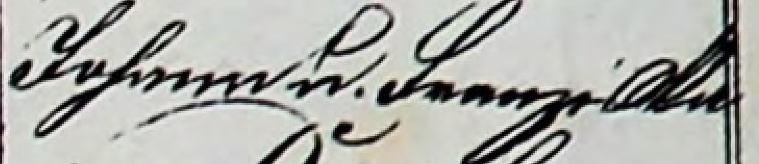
Johann u. Franziska
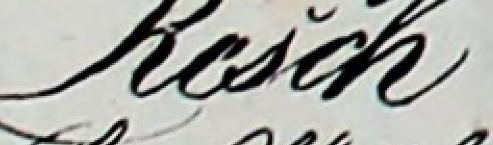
Resch
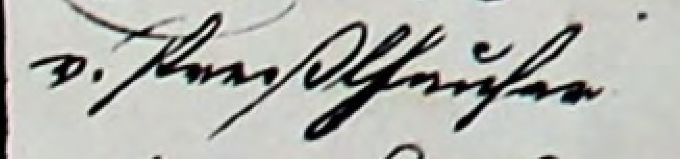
v. Preßlhaufer
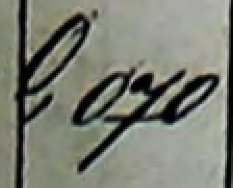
0,070
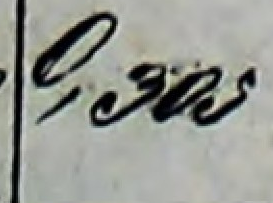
0,305
